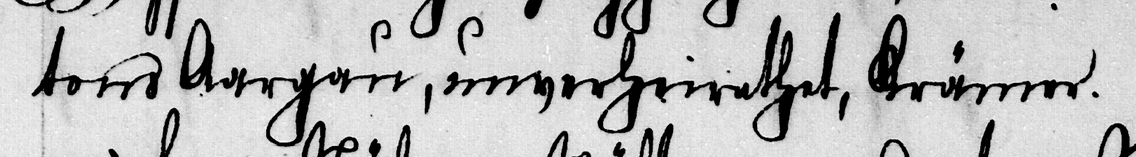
tons Aargau, unverheirathet, Krämer.
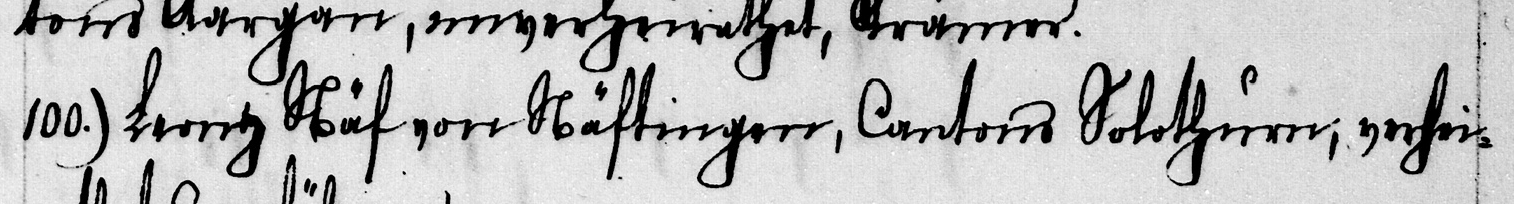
100.) Lernz Näf von Näftingen, Cantons Solothurn, verhei¬
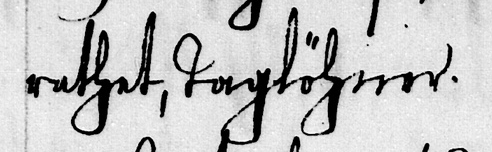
rathet, Taglöhner.
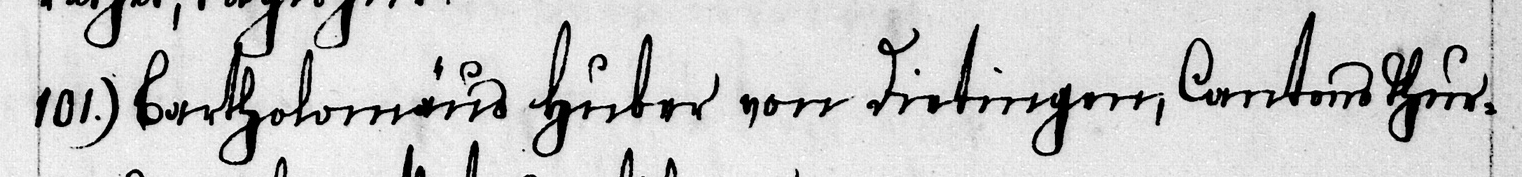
101.) Bartholomäus Huber von Dietingen, Cantons Thur¬
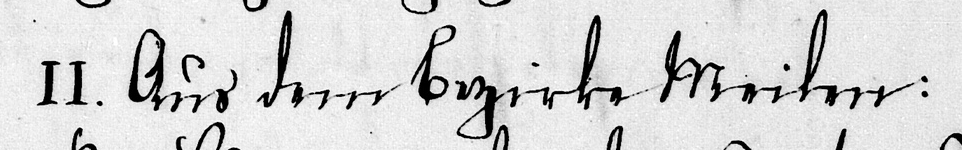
II. Aus dem Bezirke Meilen:
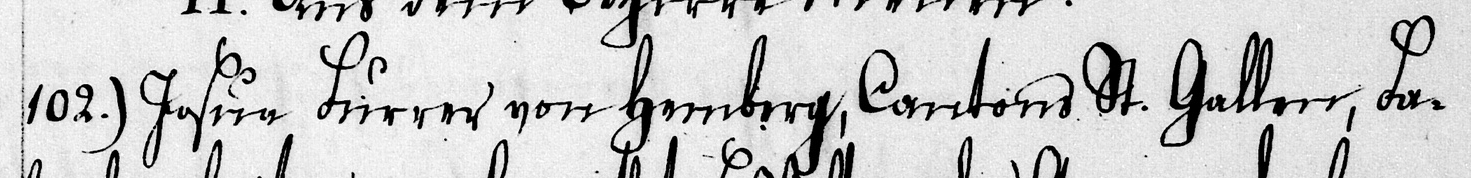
102.) Josua Furrer von Hemberg, Cantons St. Gallen, Fa¬
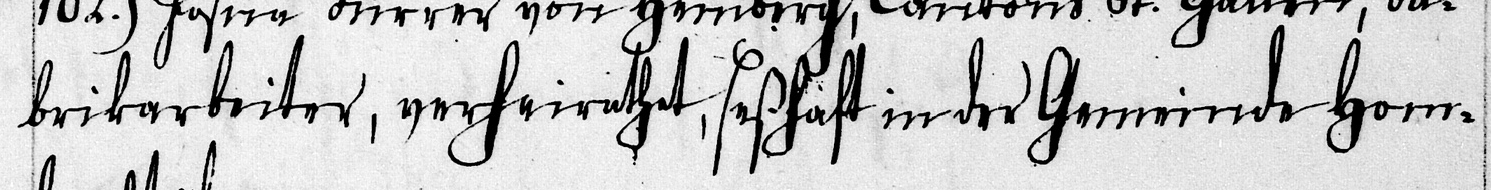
brikarbeiter, verheirathet, seßhaft in der Gemeinde Hom¬
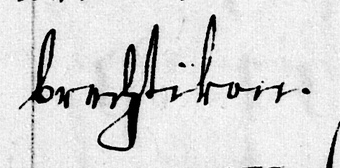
brechtikon.
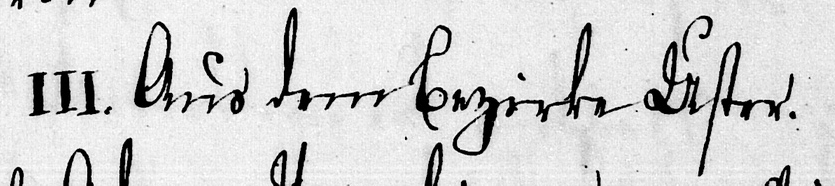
II. Aus dem Bezirke Uster.
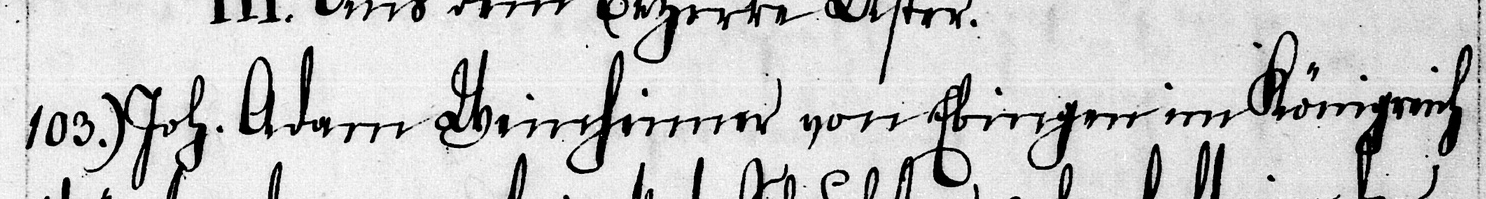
103.) Joh. Adam Weinheimer von Ebingen im Königreich
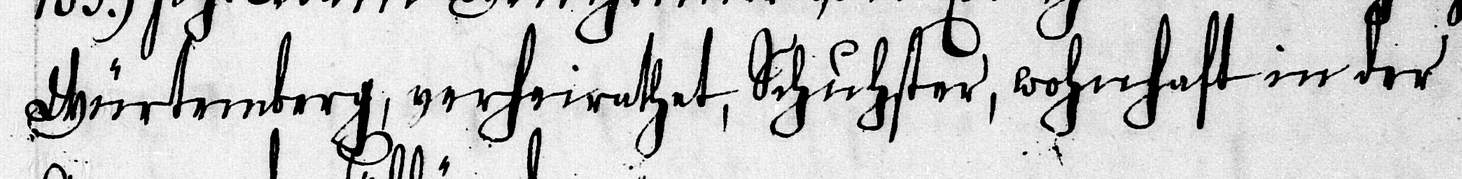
Würtemberg, verheirathet, Schuhster, wohnhaft in der
